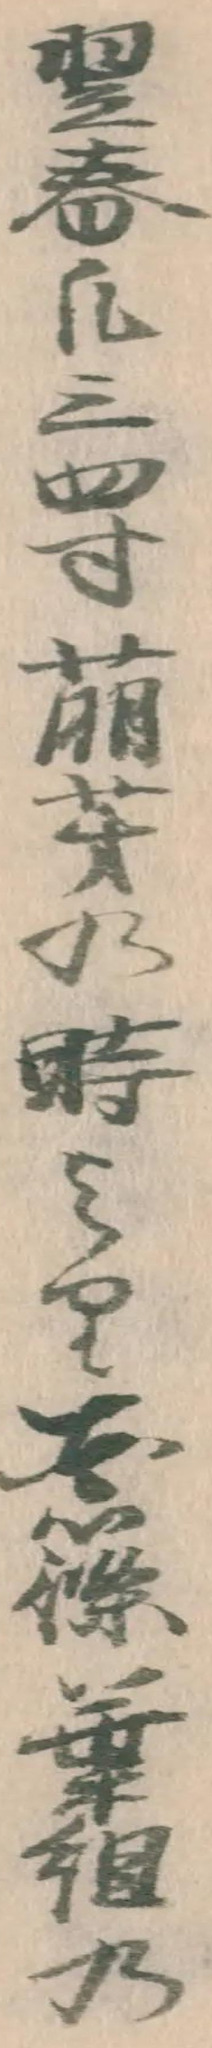翌春凡三四寸萌芽の時より花篠葉組の
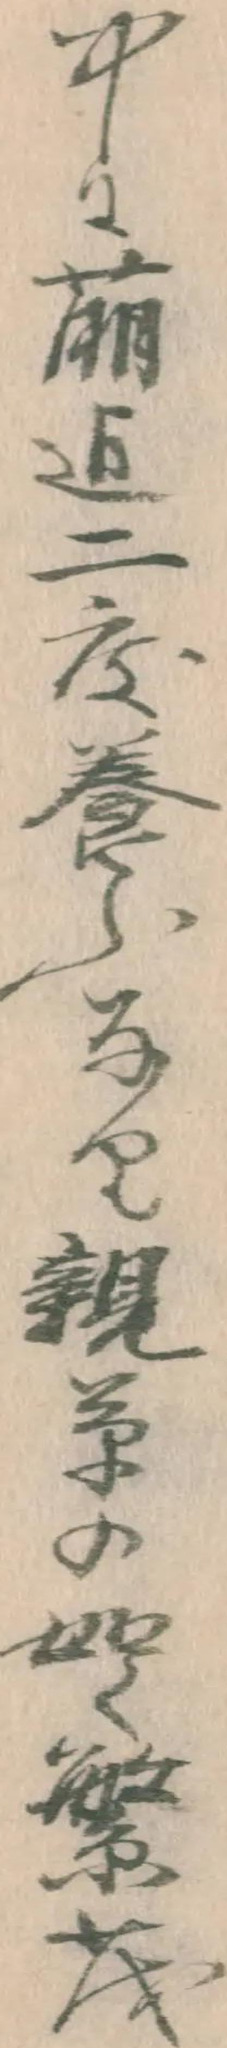中に萌迠二度養ふなり親草の如く繁茂
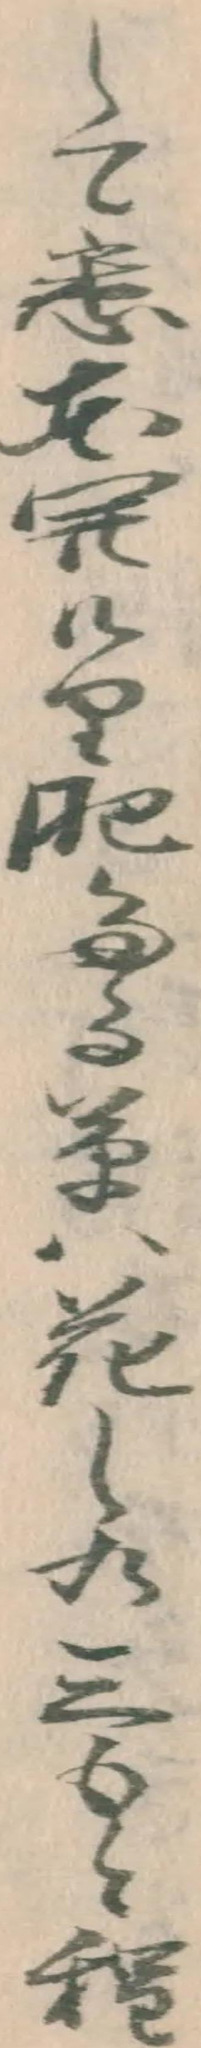して悉花開けり肥たる草ハ花くの三もと程
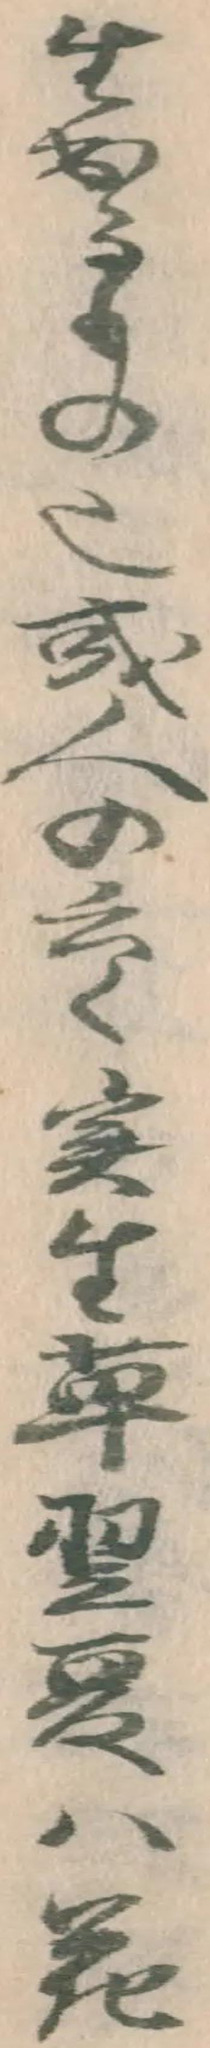生たるもの也或人の云く実生草翌夏ハ花
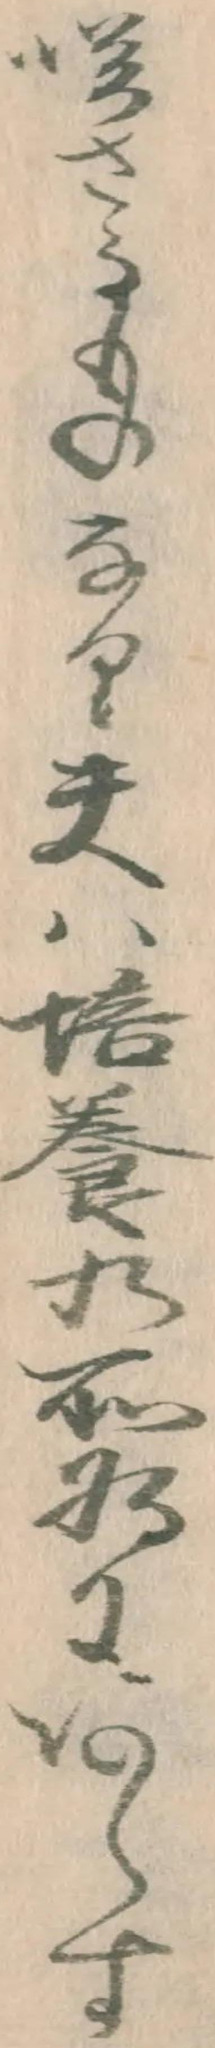咲さるものなり夫ハ培養の所為にあらす
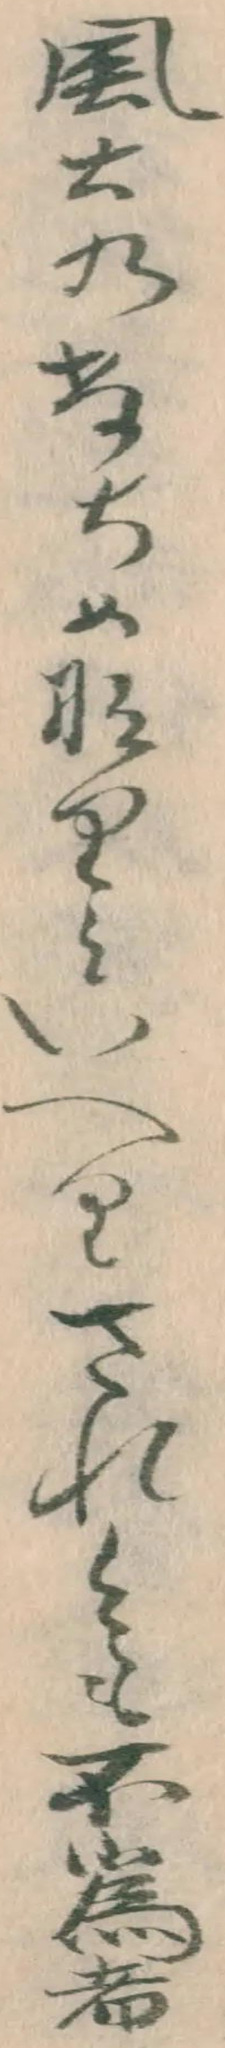風土のけちめなりといへりされとも不為者

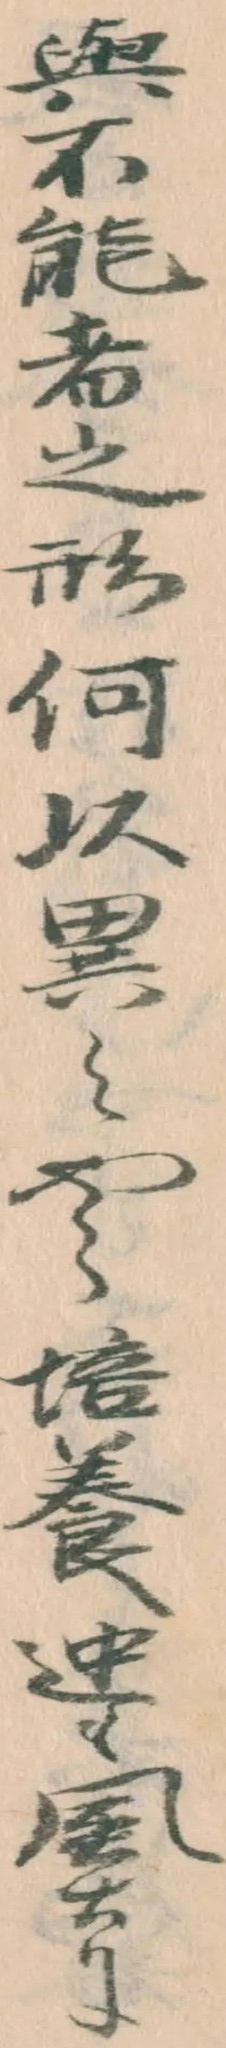與不能者之形何以異とやら培養迚も風土に
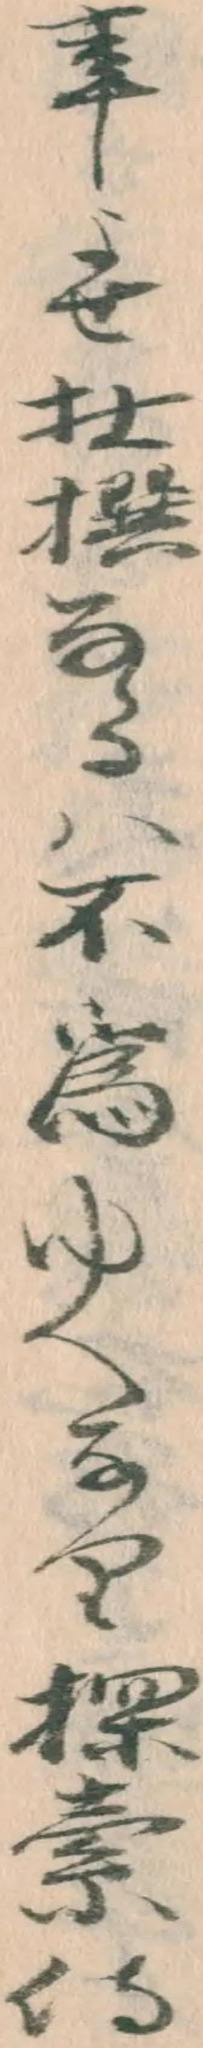事よせ杜撰なるハ不為ゆへなり探索侍
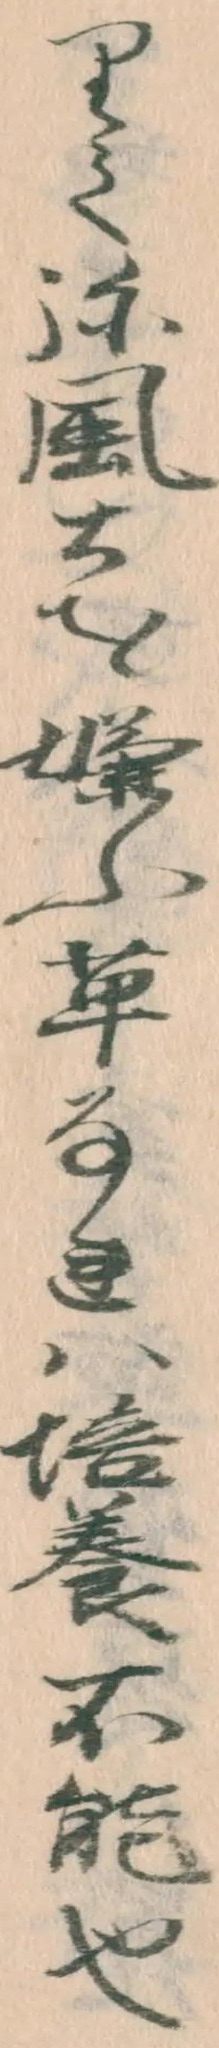りてや風土を嫌ふ草なれハ培養不能也
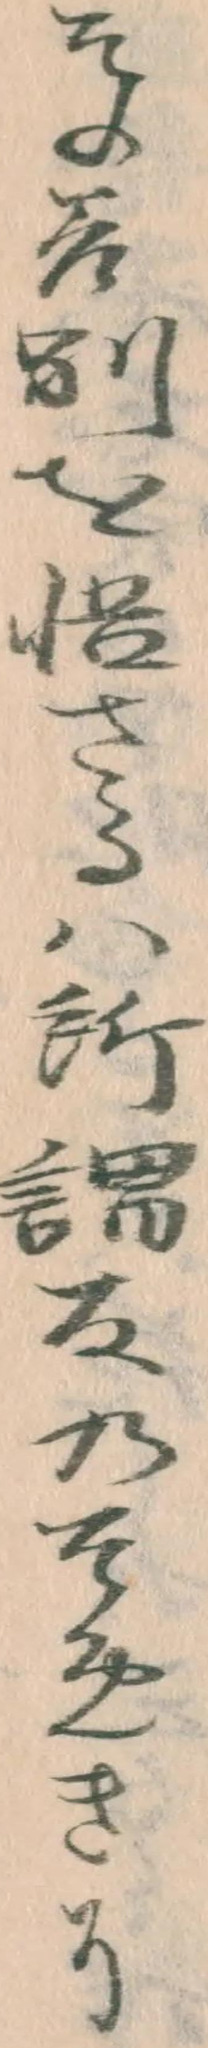その差別を悟さるハ所謂反のそめきに
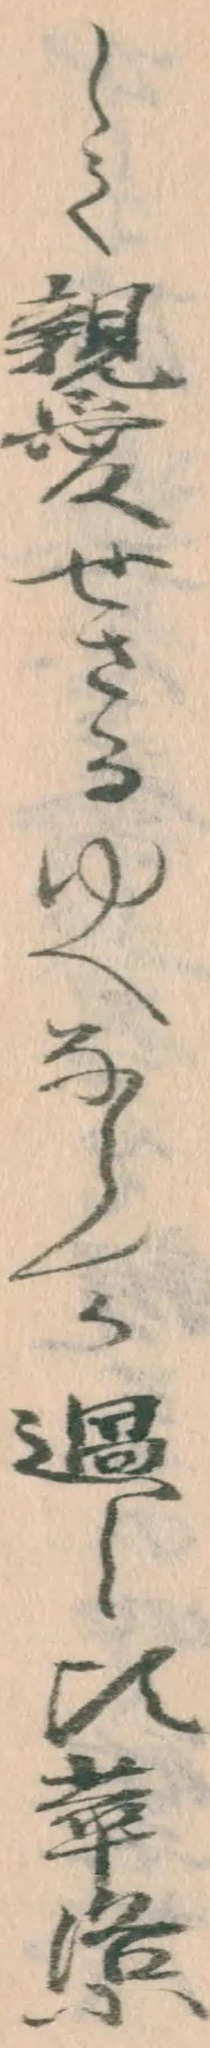して親愛せさるゆへならんか過し比華洛に
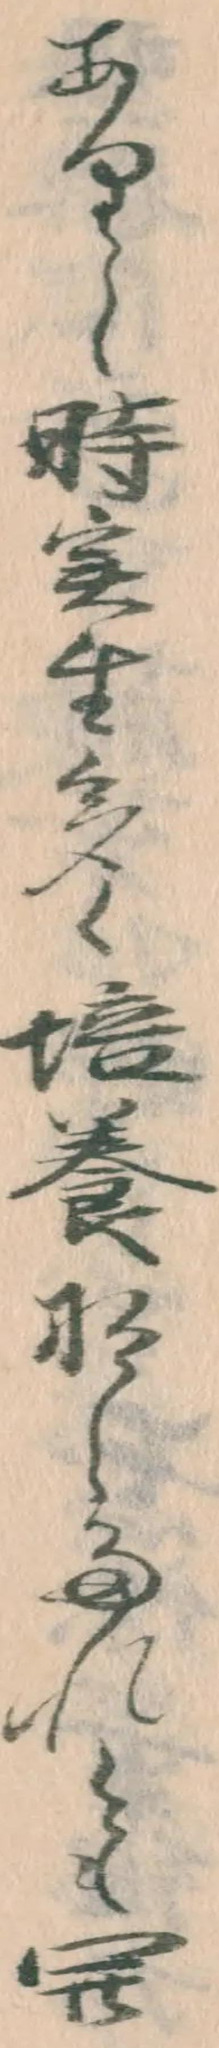ありし時実生多く培養なしたれとも開
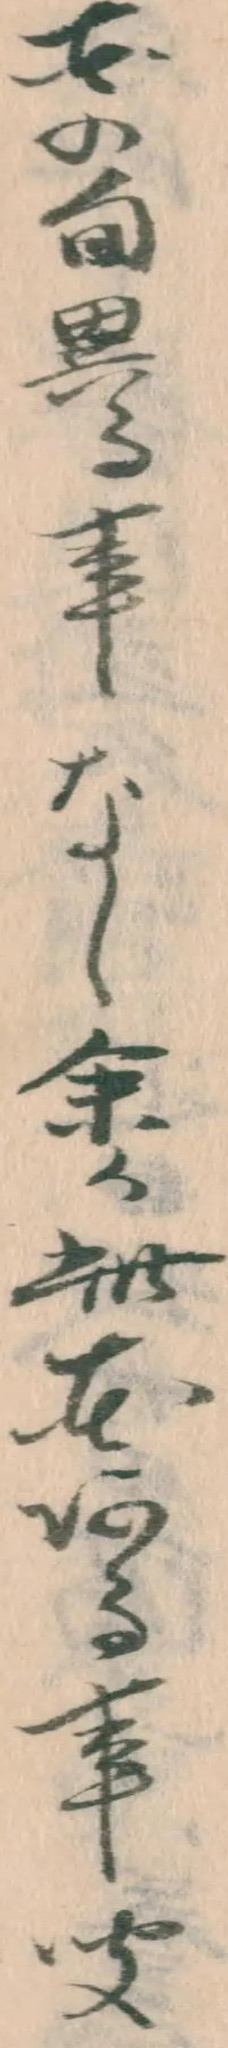花の旬異る事なし余か此花ある事聞
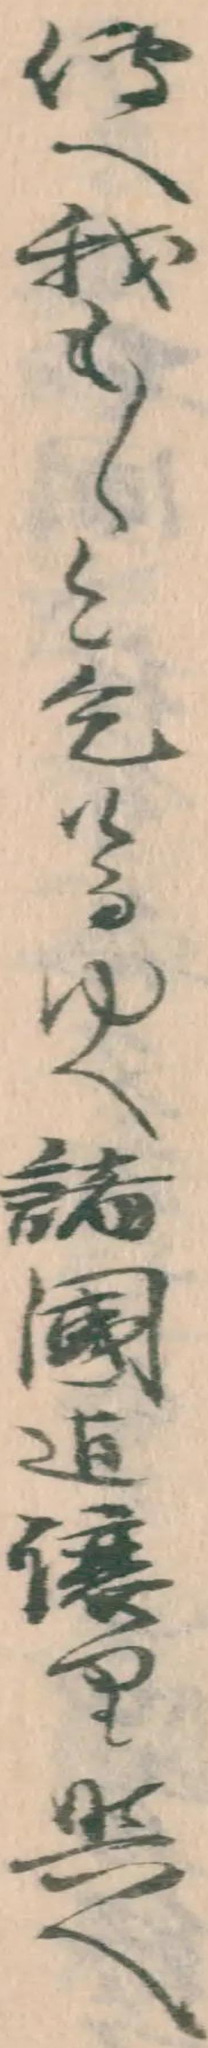伝へ我も〳〵と乞けるゆへ諸国迠譲り与へ
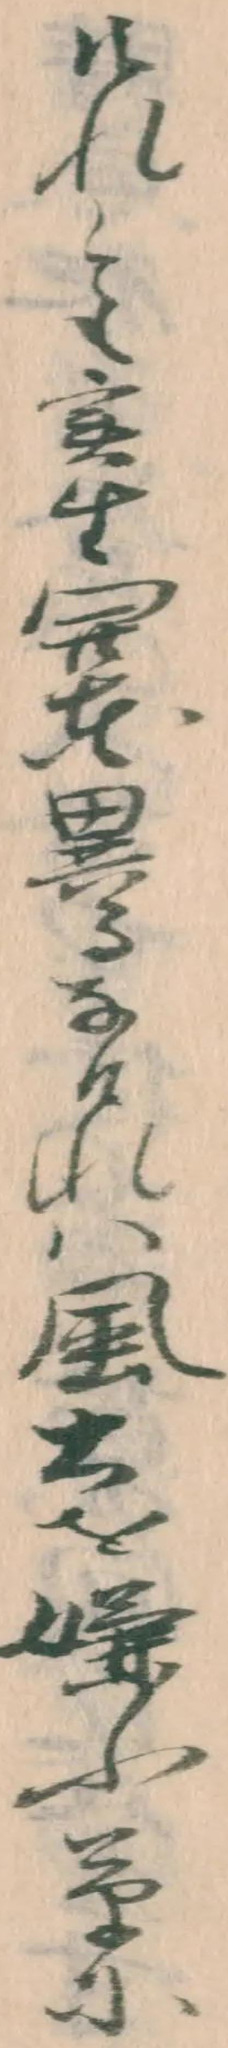けれとも実生開花異るなけれハ風土を嫌ふ草に
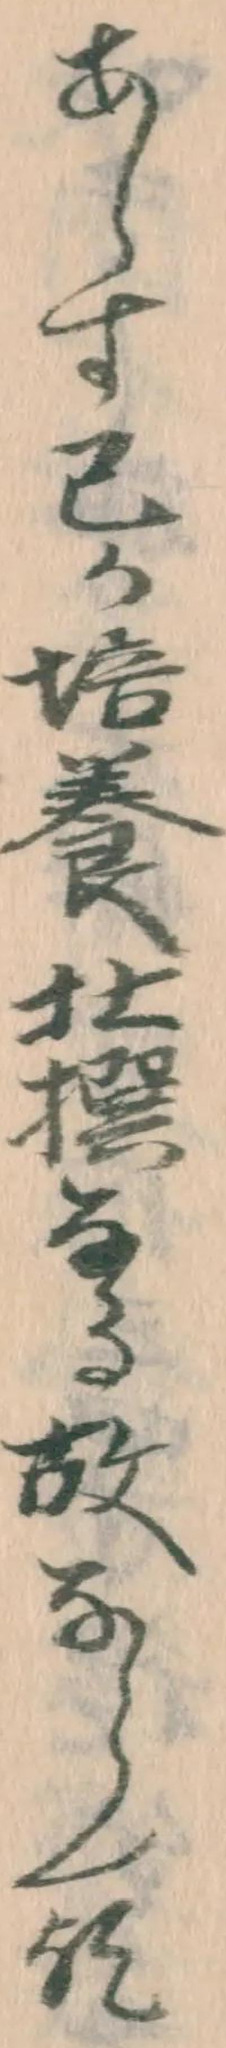あらす己か培養杜撰なる故ならん哉
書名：花菖培養録
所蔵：国立国会図書館 National Diet Library, JAPAN
